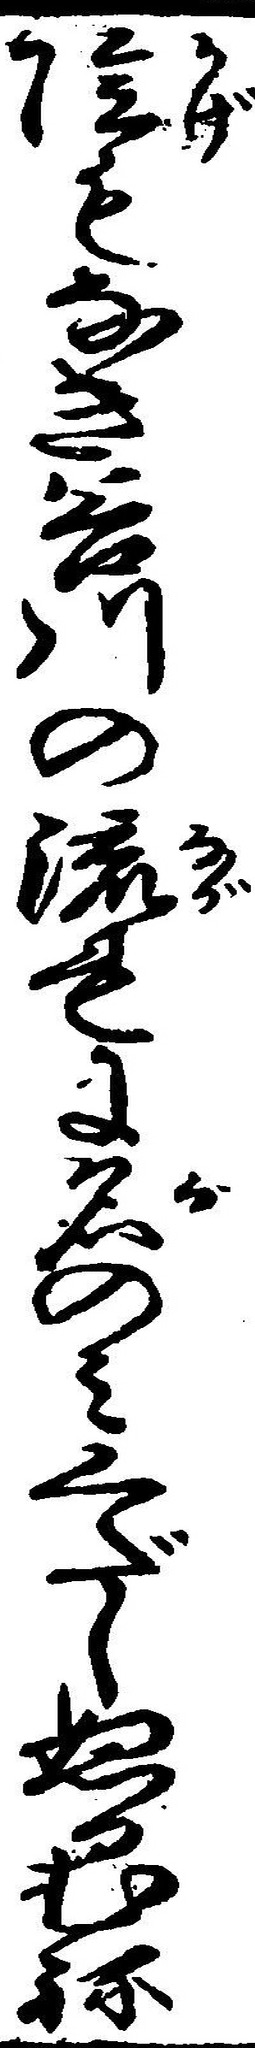陰もなき谷川の流れに名のみくだしぬるむね
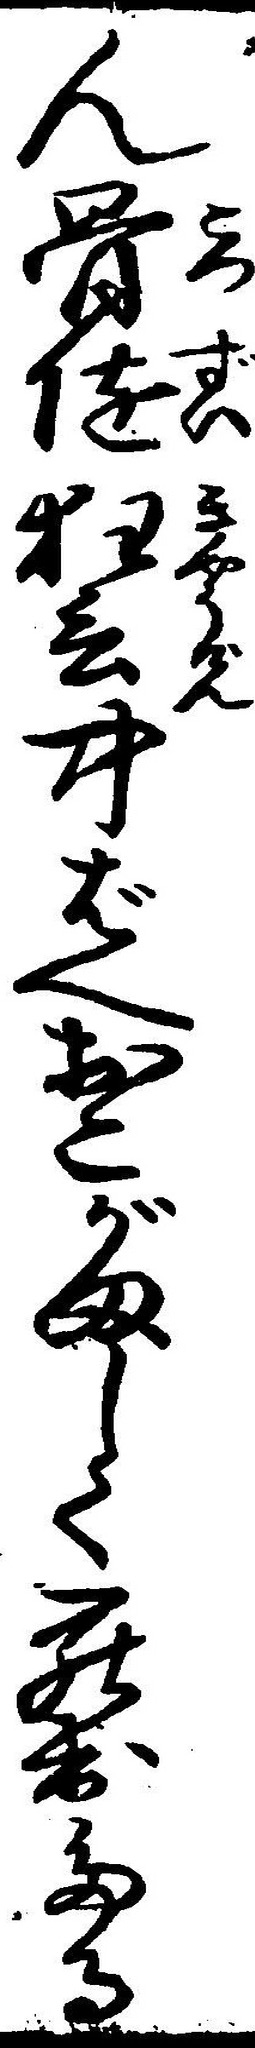ん骨随狂言中ばへおこがましく罷出たる
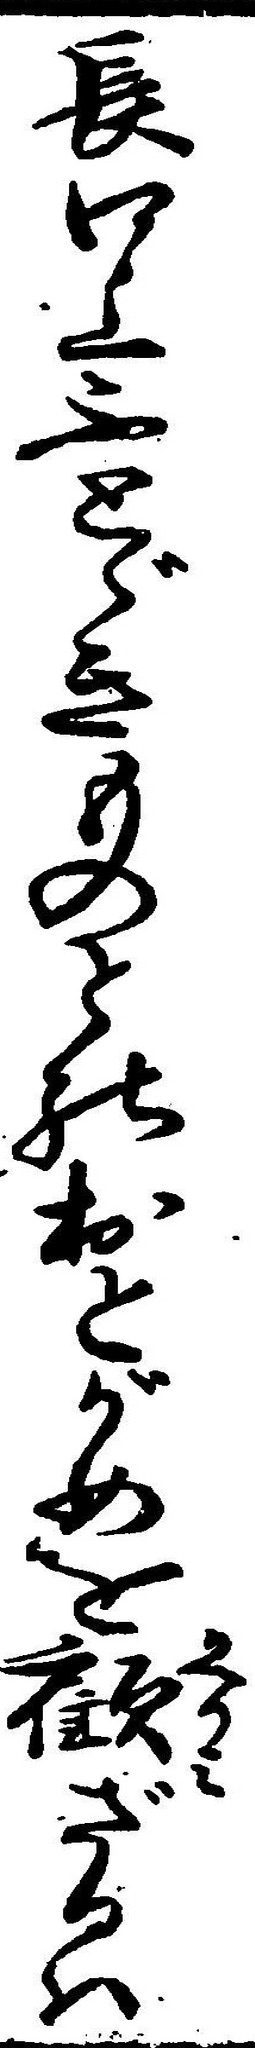長口上ふとゞきものとのおとがめを顧ざるは
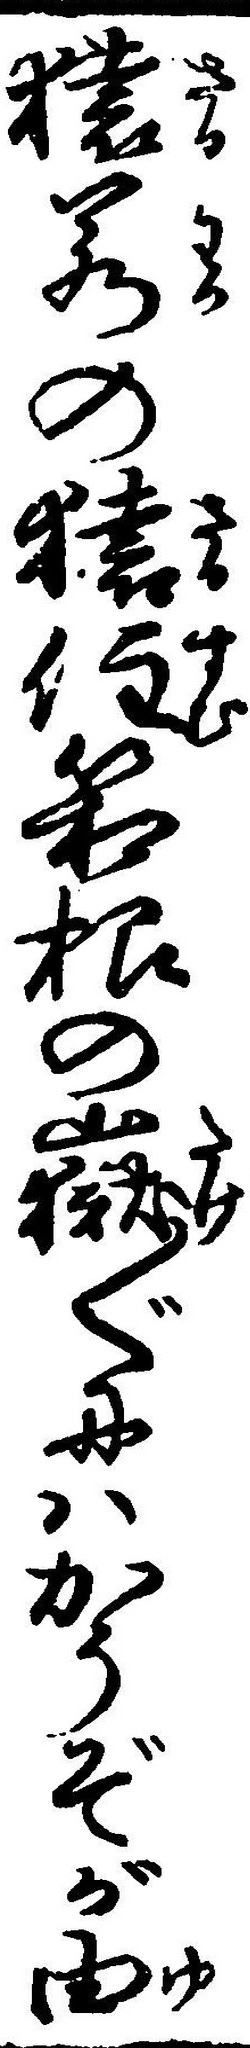猿若の猿住箱根の岳〴〵にはかうぞが由
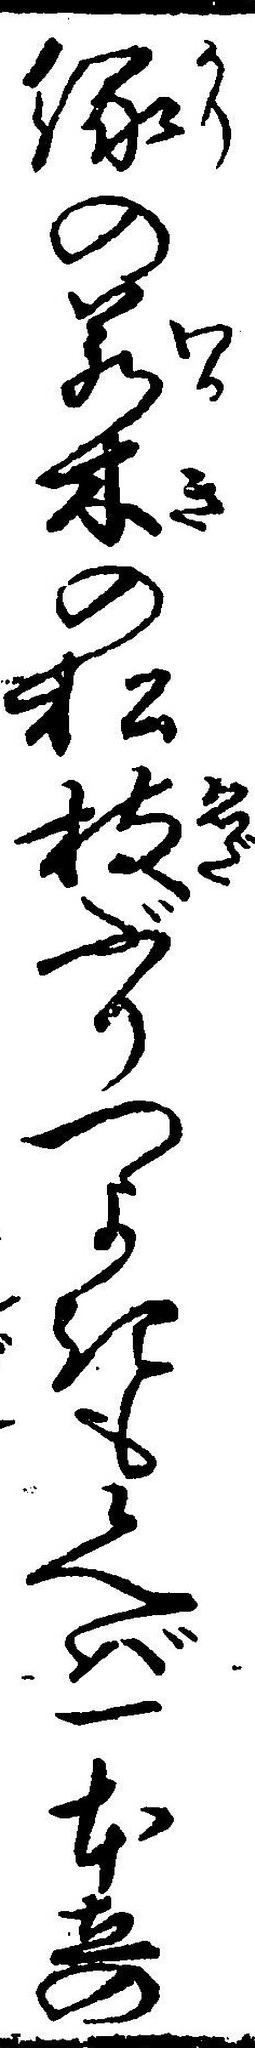縁の若木の松枝ぶりつよきも候へば一本立の
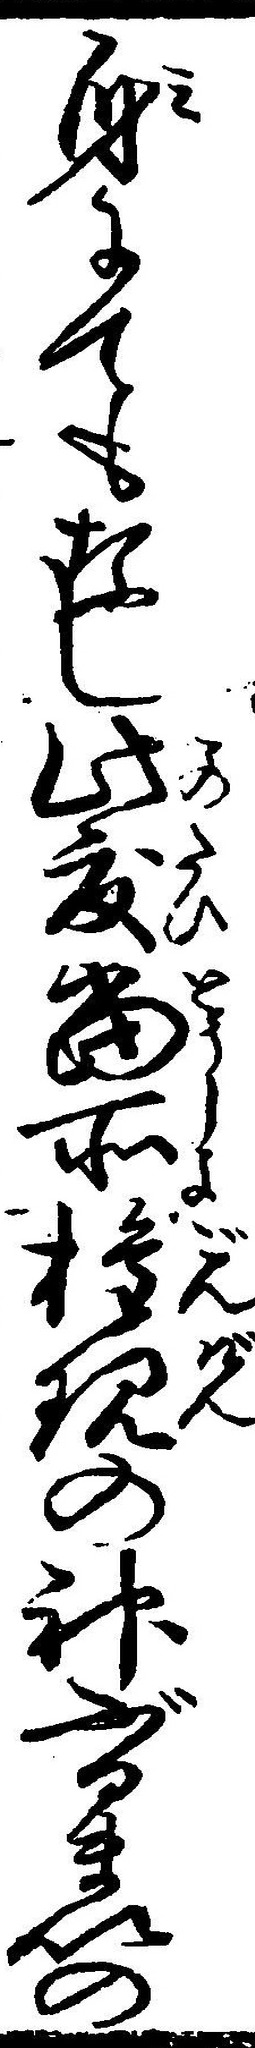身にてもなし此度当所権現の神ぶるまいの
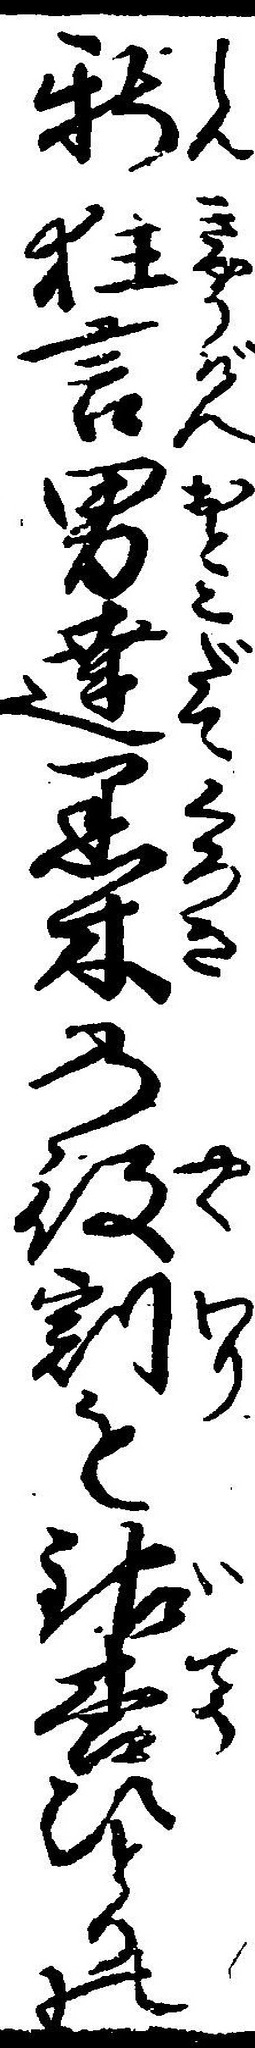新狂言男達黒木の役割も銀杏ひとりの

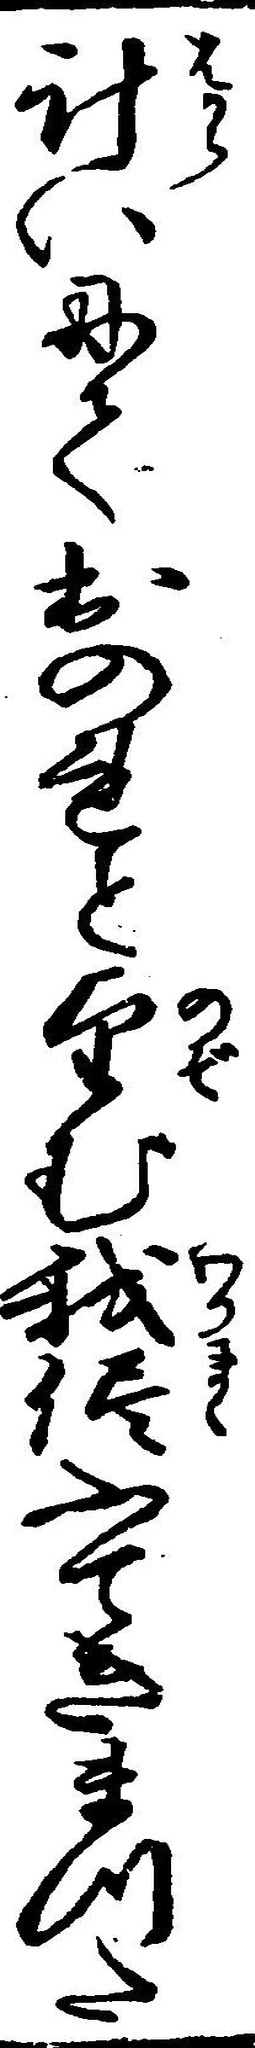計いにておのれと望む我侭にてきまつた
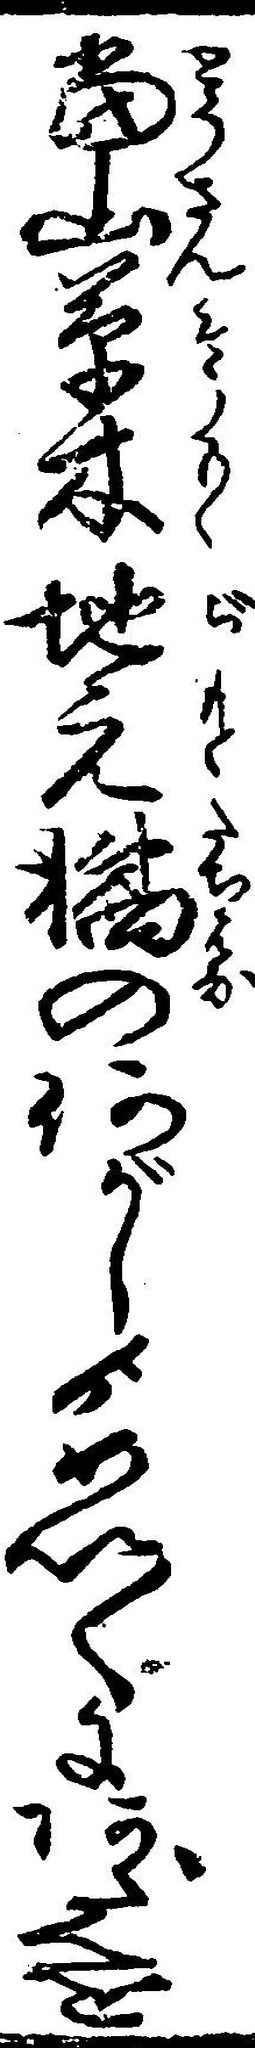当山草木地元橘の何がしゟめい〳〵にあたへを
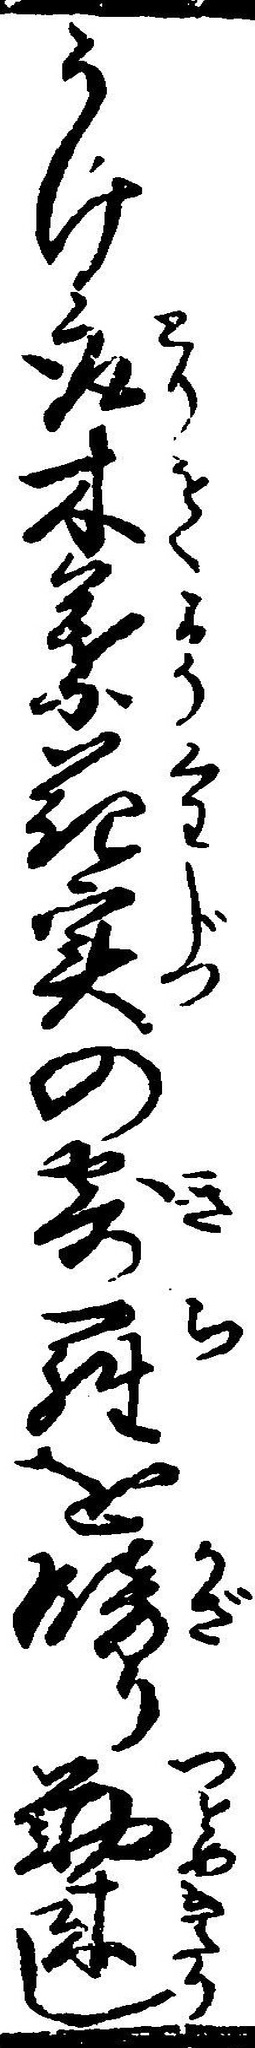うけ取木葉花実の奇羅を飾り勤来し
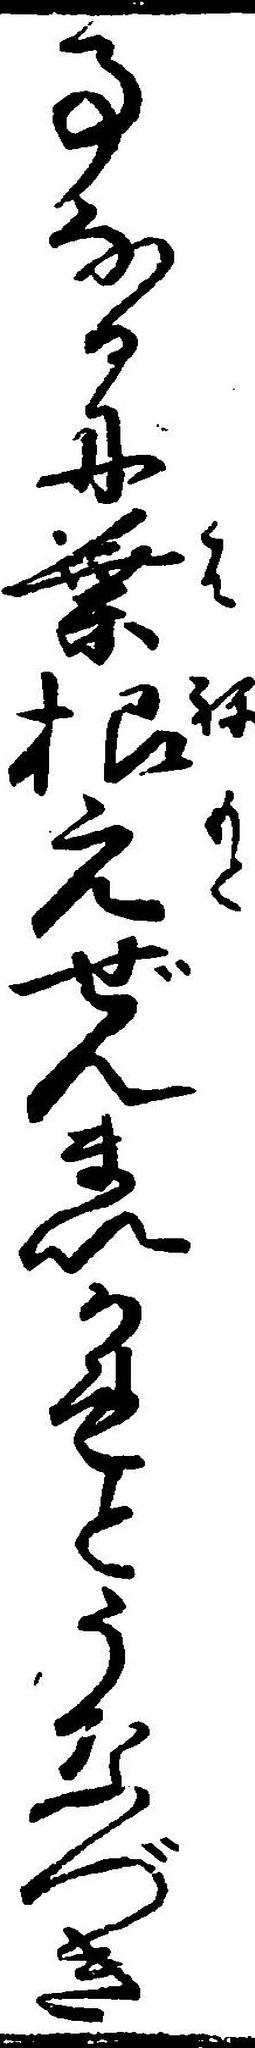事なるに葉根元ぜんまいかれとうなづき
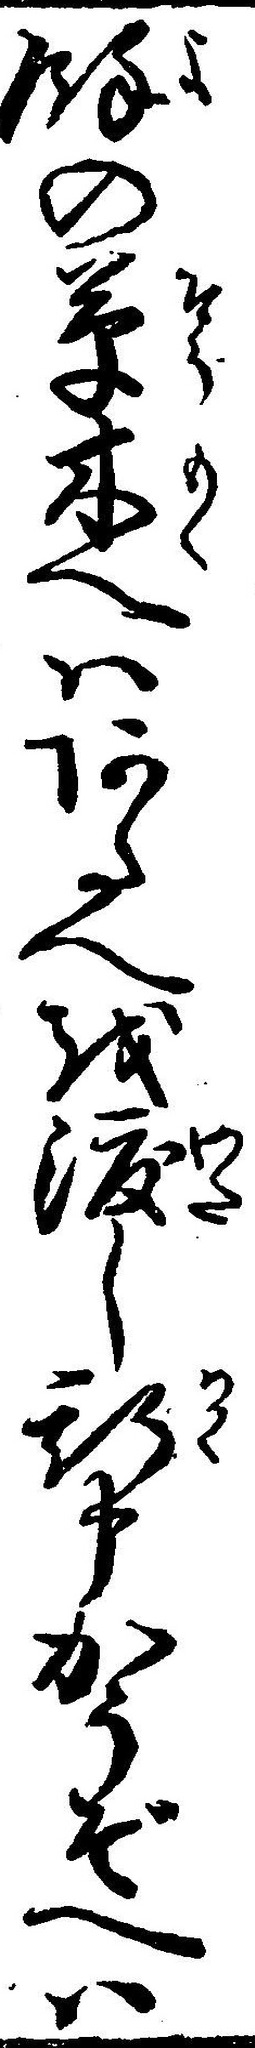余の草木へはあたへを渡し斯申かうぞへは
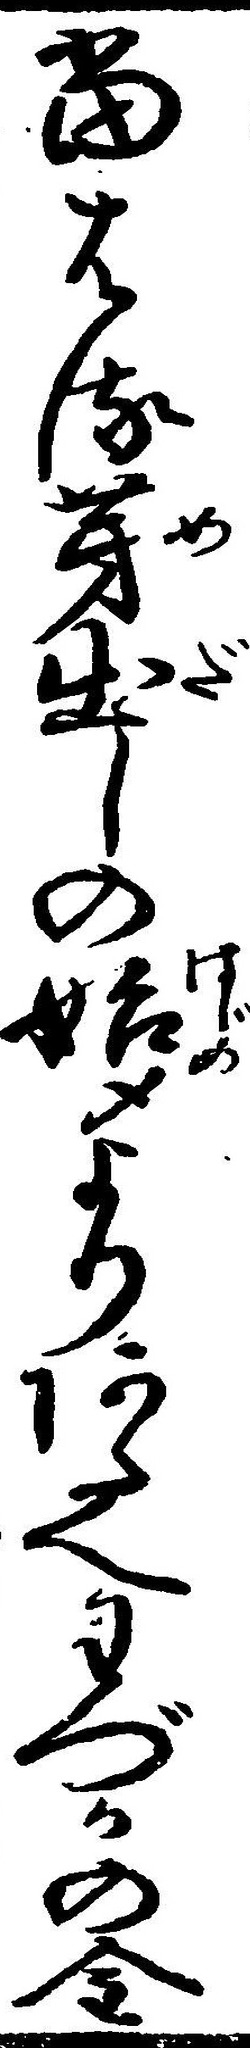当はる芽出しの始金
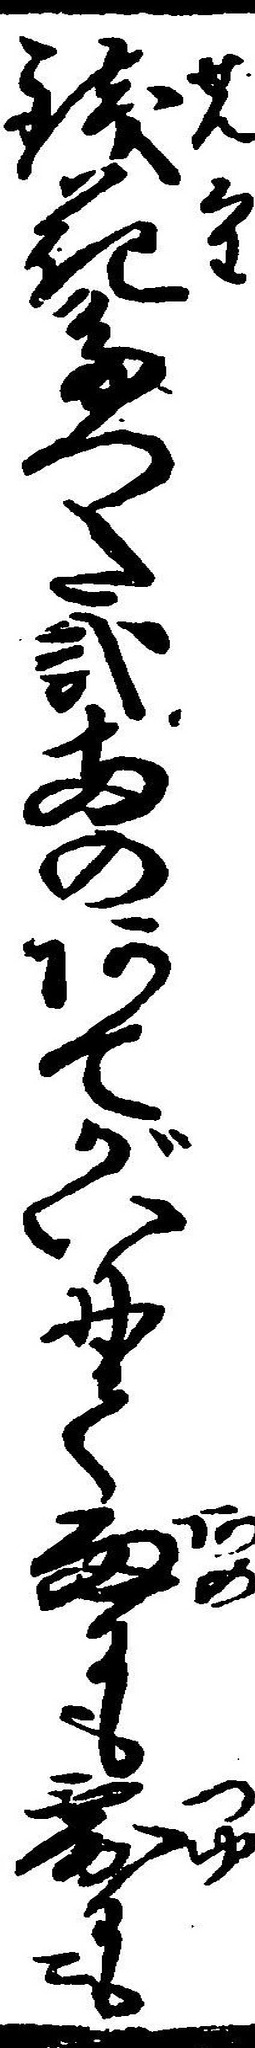銭花たつた弐両のあてがいにて雨にも露にも
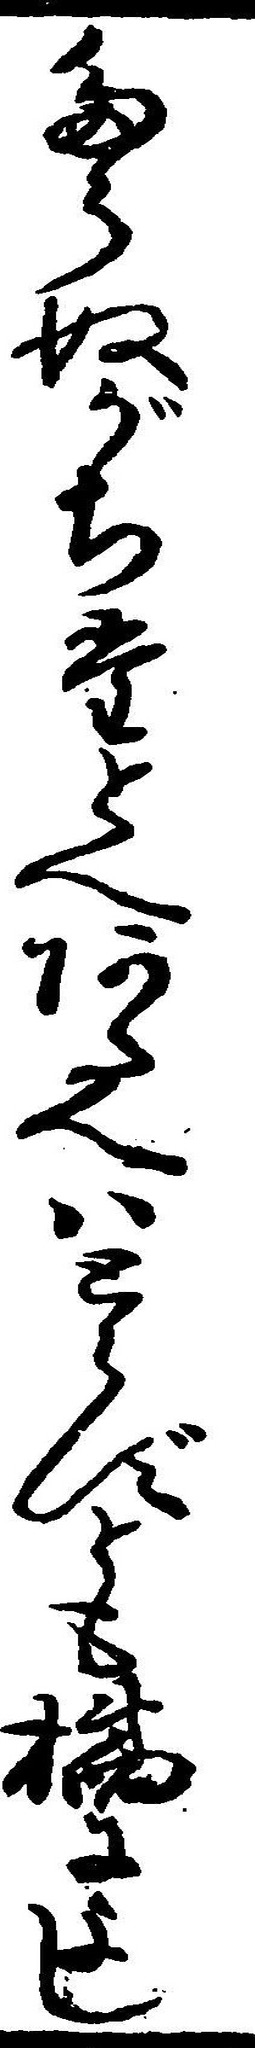たらぬがちたとへあたへはとらずとも橘によし
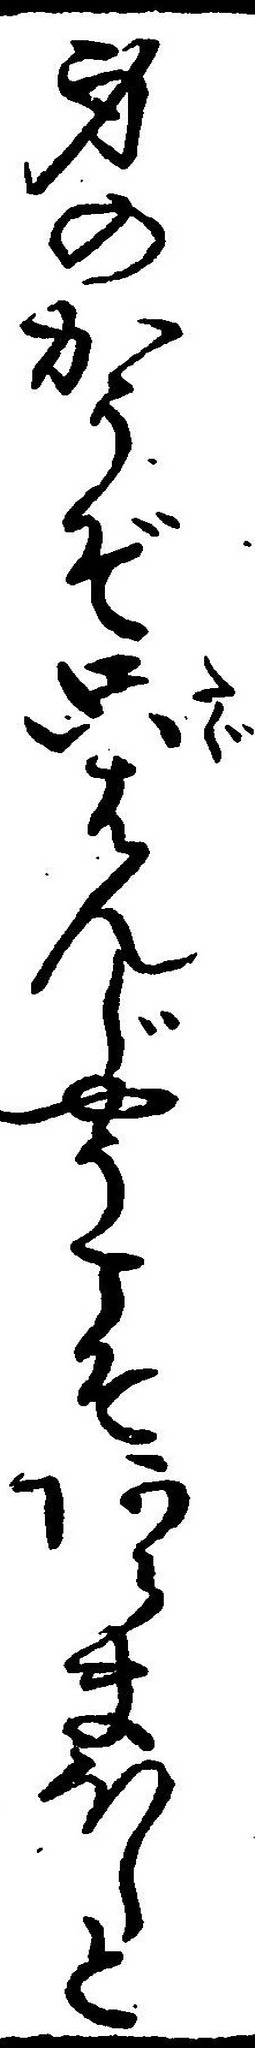身のかうぞ只はんじやうこそあらまほしと
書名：草木芝居化物退治 / 泉花堂三蝶(十六兵衛)作
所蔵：東京大学総合図書館 General Library in the University of Tokyo, JAPAN
